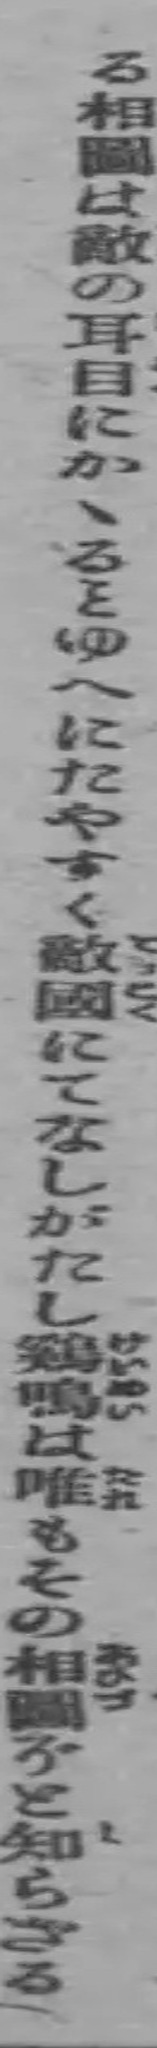る相図は敵の耳目にかゝることゆへにたやすく敵国にてなしがたし鶏鳴は唯もその相図ぞと知らざる
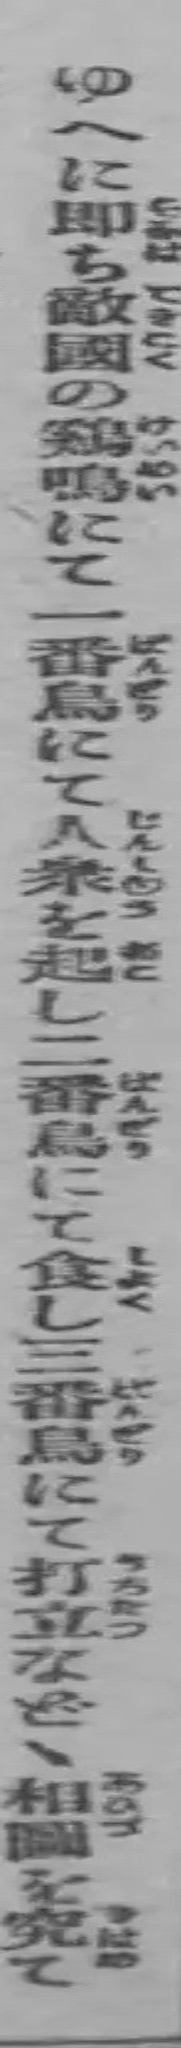ゆへに即ち敵国の鶏鳴にて一番鳥にて人衆を起し二番鳥にて食し三番鳥にて打立などゝ相図を究て
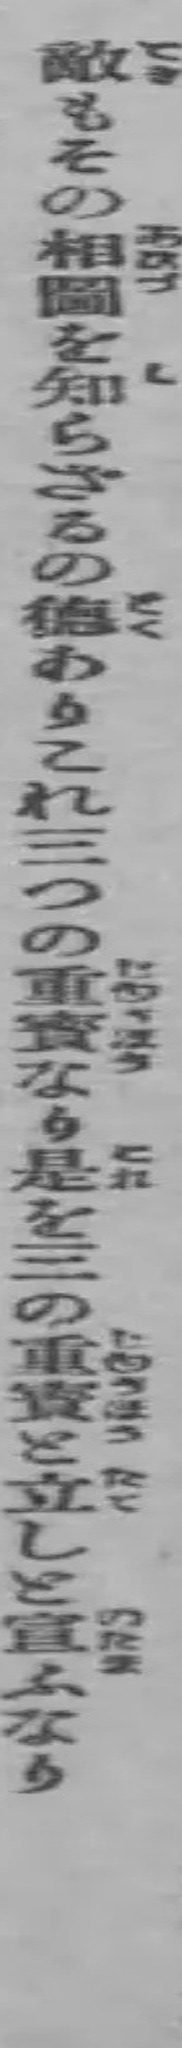敵もその相図を知らざるの徳ありこれ三つの重宝なり是を三の重宝と立しと宣ふなり
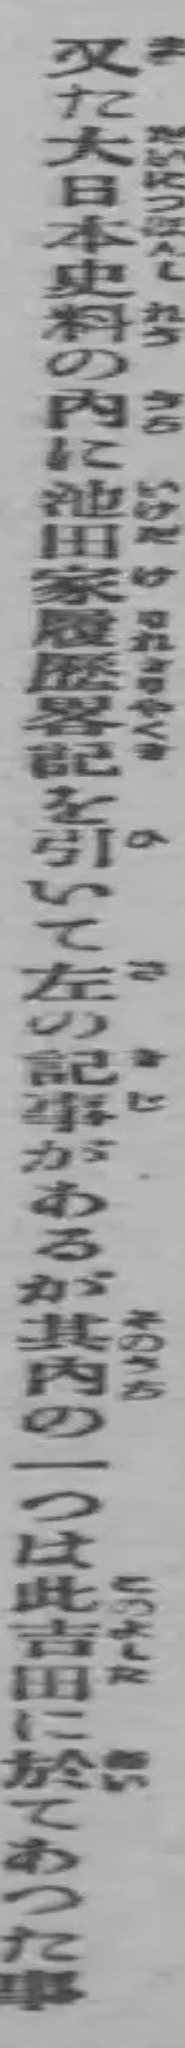輝政の寛大又た大日本史料の内に池田家履歴略記を引いて左の記事があるが其内の一つは此吉田に於てあつた事
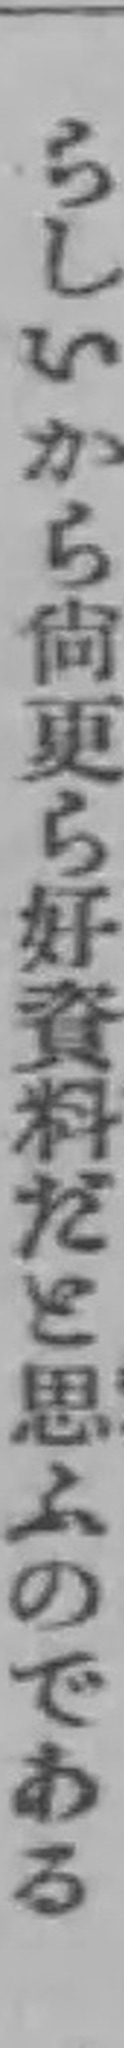らしいから尚更ら好資料だと思ふのである
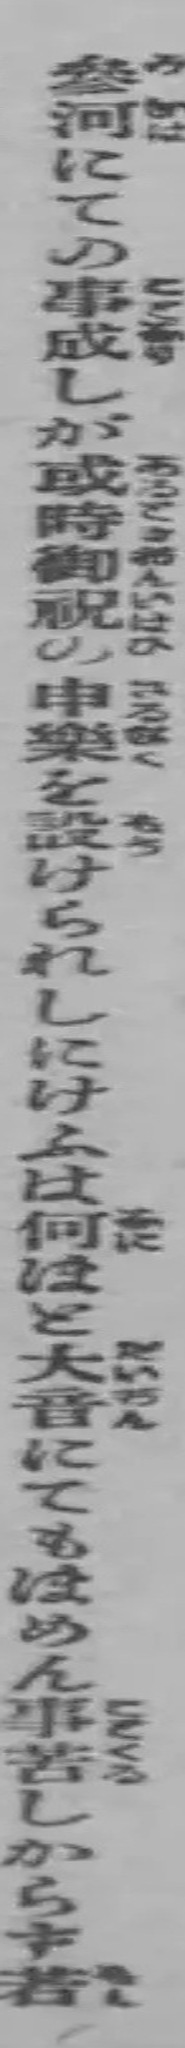参河にての事成しが或時御祝の申楽を設けられしにけふは何ほと大音にてもほめん事苦しからず若
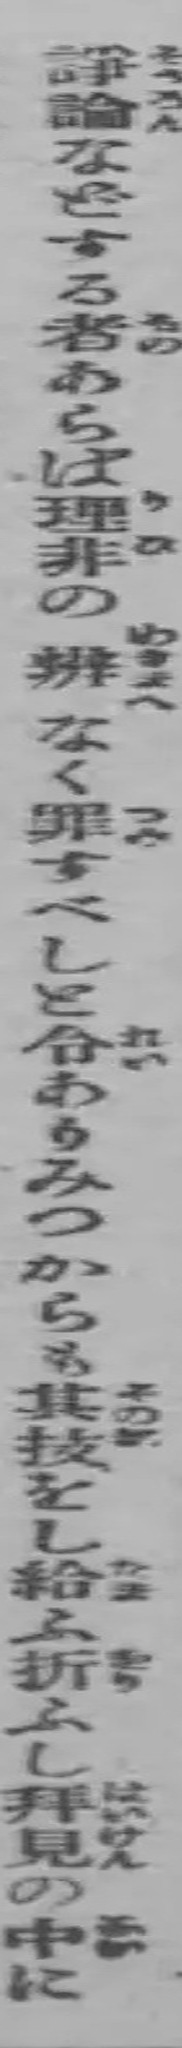諍論などする者あらば理非の弁なく罪すべしと令ありみつからも其技をし給ふ折ふし拝見の中に
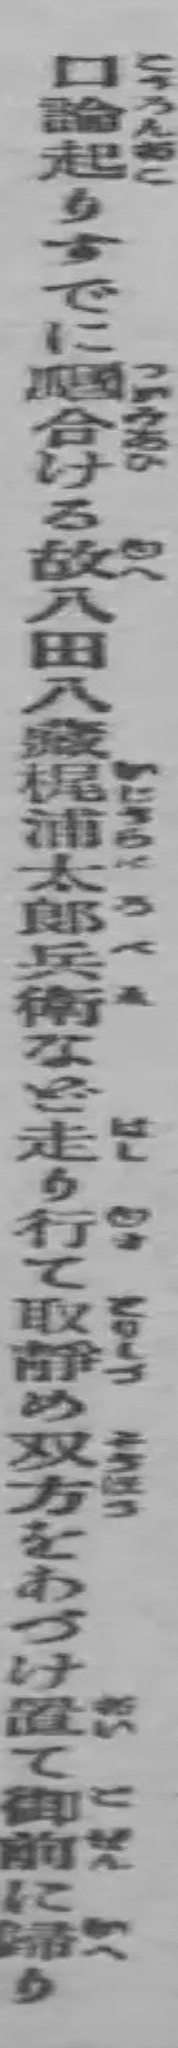口論起りすでに掴合ける故八田八蔵梶浦太郎兵衛など走り行て取静め双方をあづけ置て御前に帰り
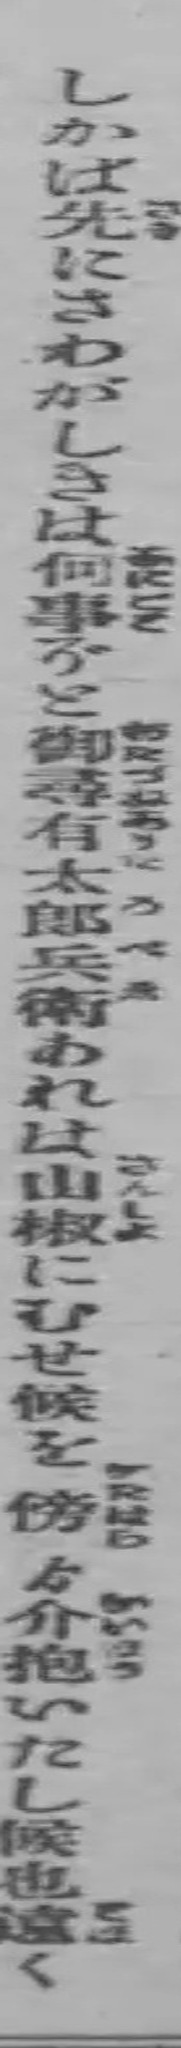しかば先にさわがしきは何事ぞと御尋有太郎兵衛あれは山椒にむせ候を傍ゟ介抱いたし候也遠く
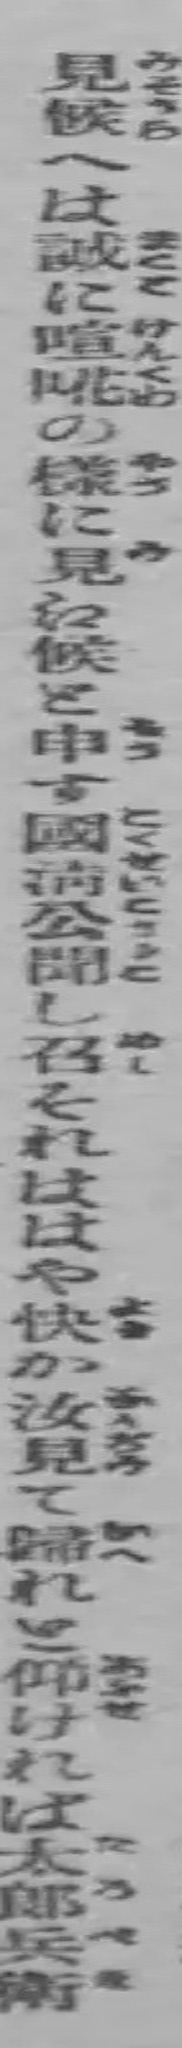見候へは誠に喧嘩の様に見え候と申す国清公聞し召それははや快か汝見て帰れと仰ければ太郎兵衛
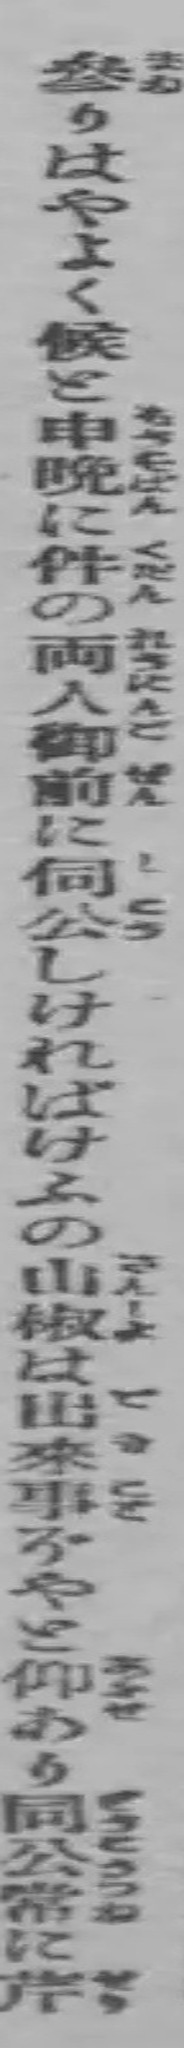参りはやよく候と申晩に件の両人御前に伺公しければけふの山椒は出来事ぞやと仰あり同公常に芹
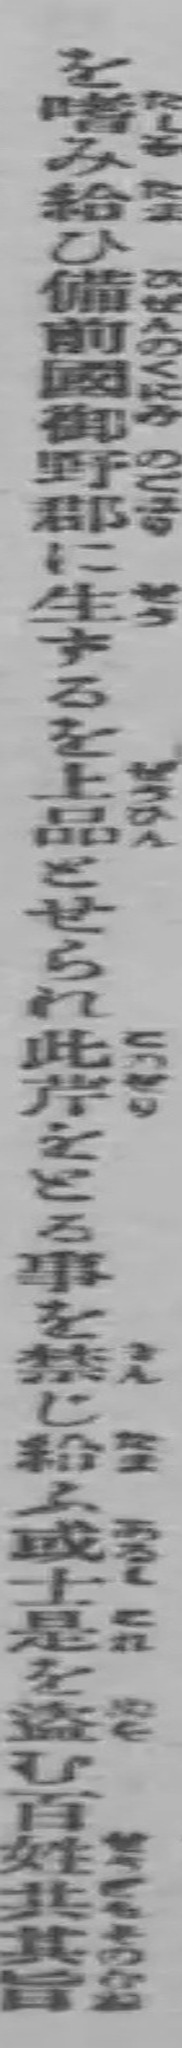を嗜み給ひ備前国御野郡に生ずるを上品とせられ此芹をとる事を禁じ給ふ或士是を盗む百姓共其旨
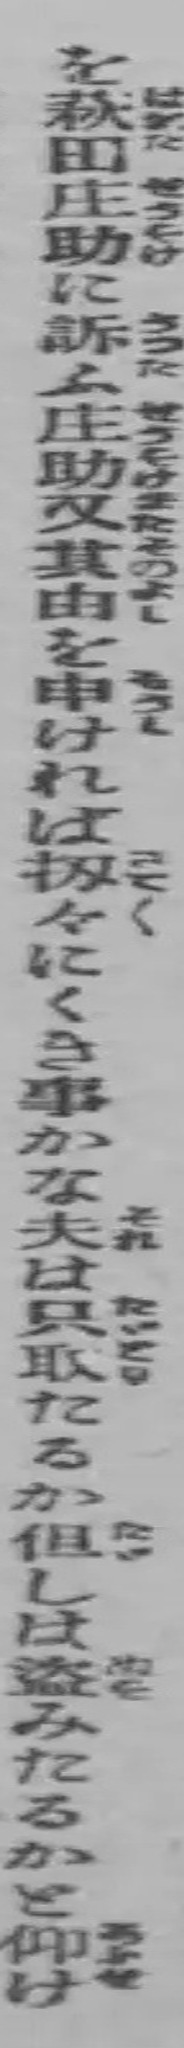を萩田庄助に訴ふ庄助又其由を申ければ扨々にくき事かな夫は只取たるか但しは盗みたるかと仰け
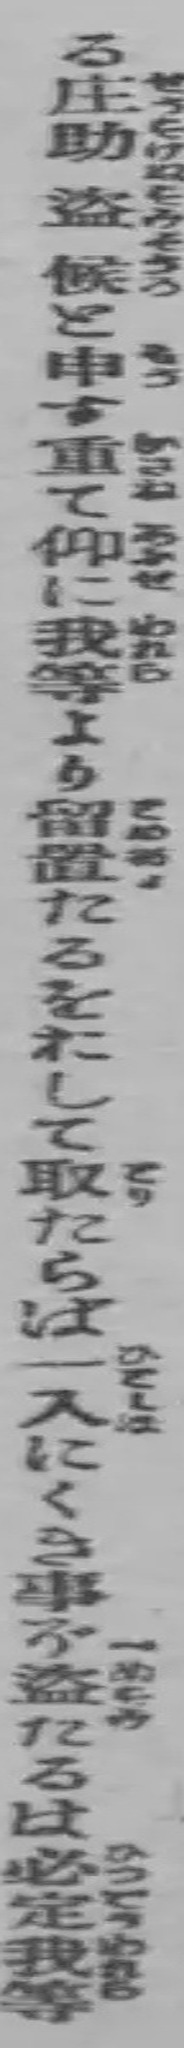る庄助盗候と申す重て仰に我等より留置たるをおして取たらば一入にくき事ぞ盗たるは必定我等
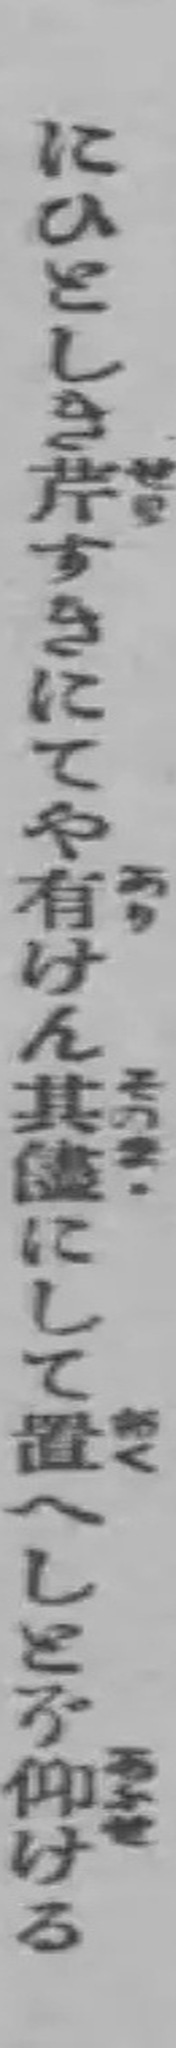にひとしき芹すきにてや有けん其侭にして置へしとぞ仰ける
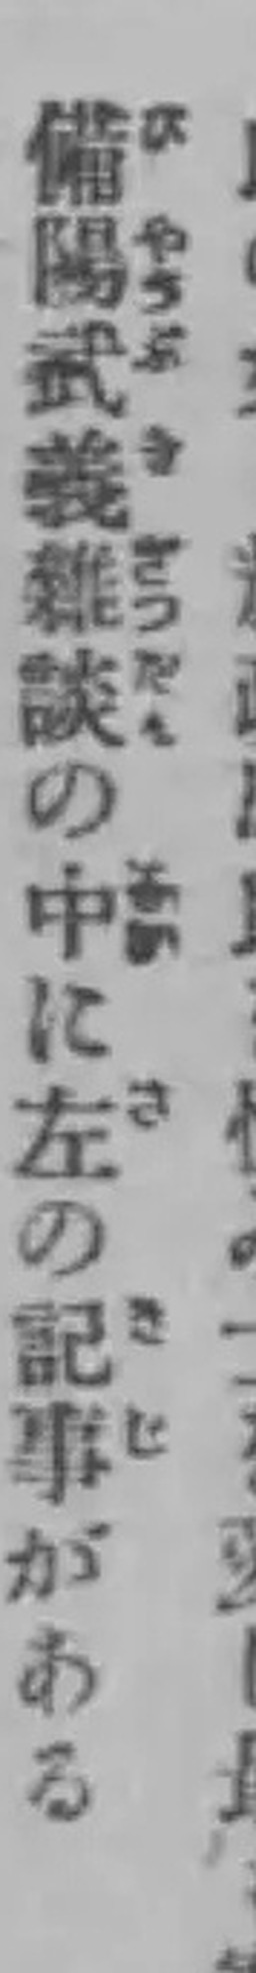備陽武義雑談の中に左の記事がある
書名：豊橋市史談
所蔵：国立国会図書館 National Diet Library, JAPAN
